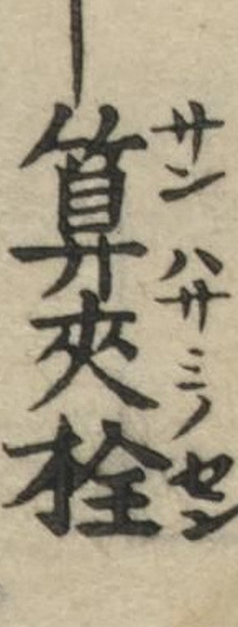算夾栓
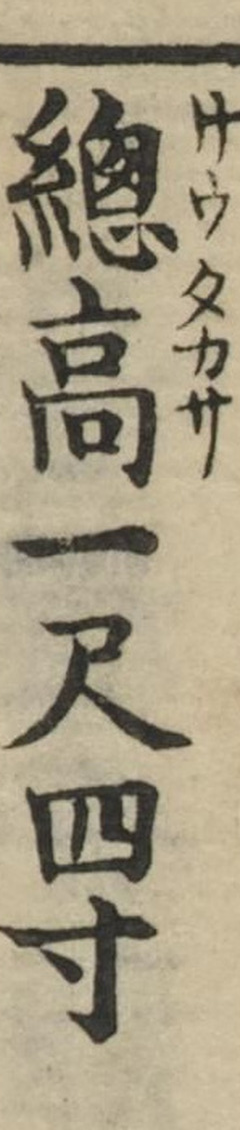総高一尺四寸
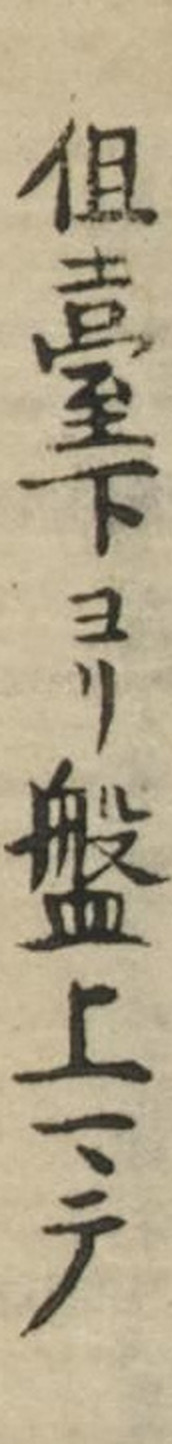但台下ヨリ盤上マテ

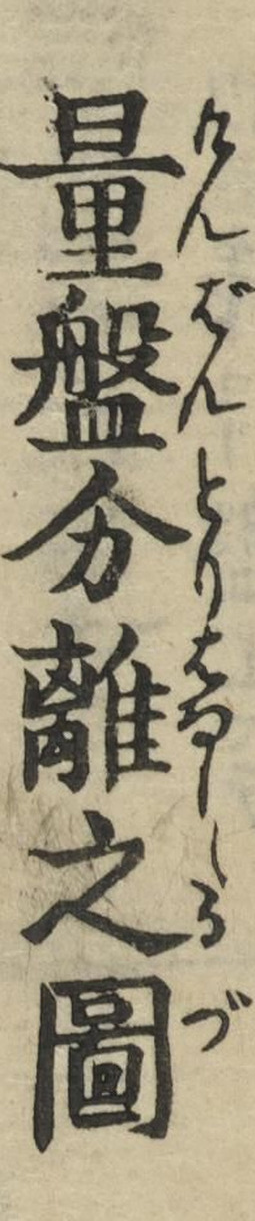量盤分離之図
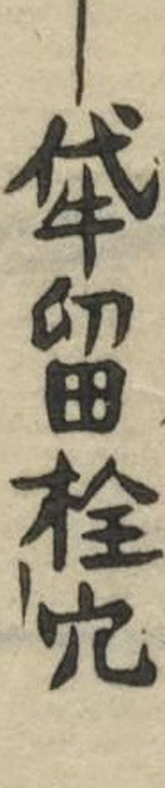牮留栓－穴
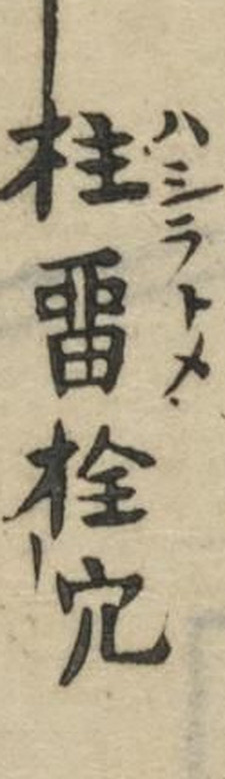柱留栓－穴
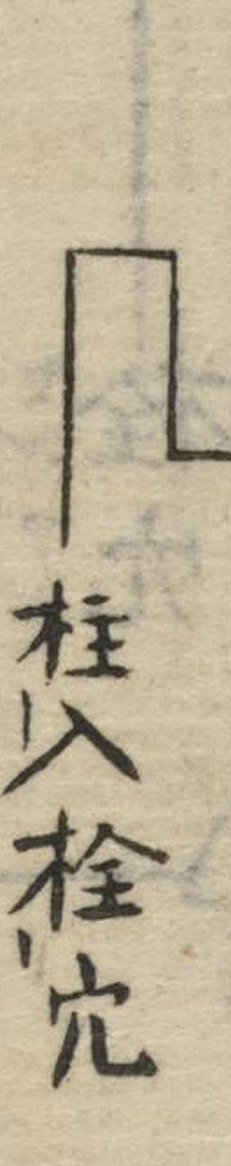柱－穴
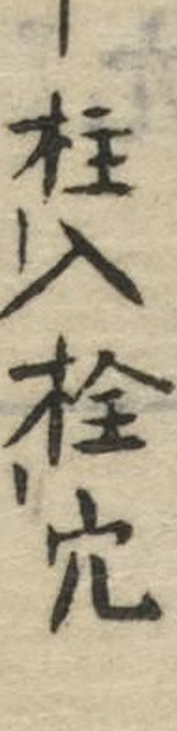柱留栓－穴
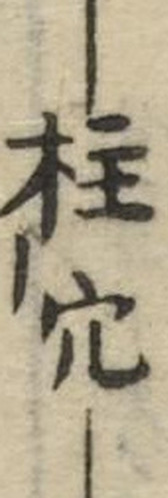柱－穴
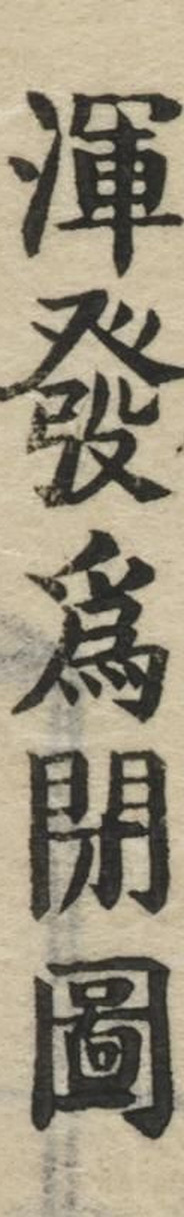渾発為開図
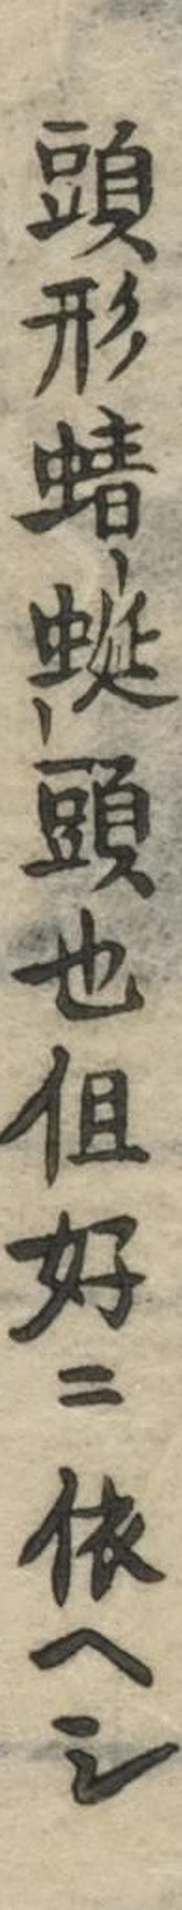頭形蜻蜒頭也但好ニ依ヘシ
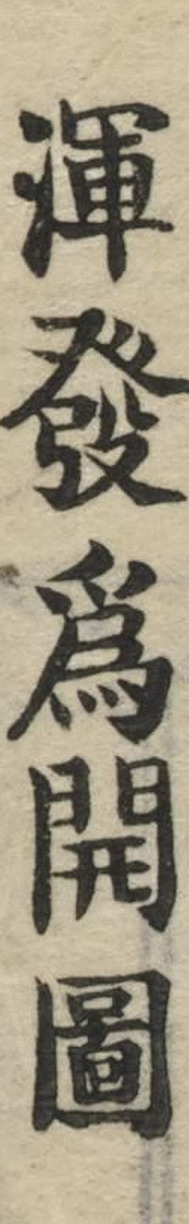渾発為開図
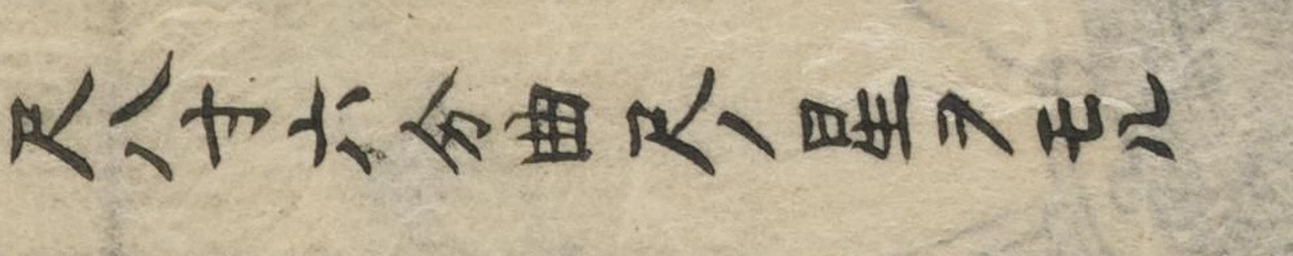長一尺八寸六分曲尺ノ星ヲモル
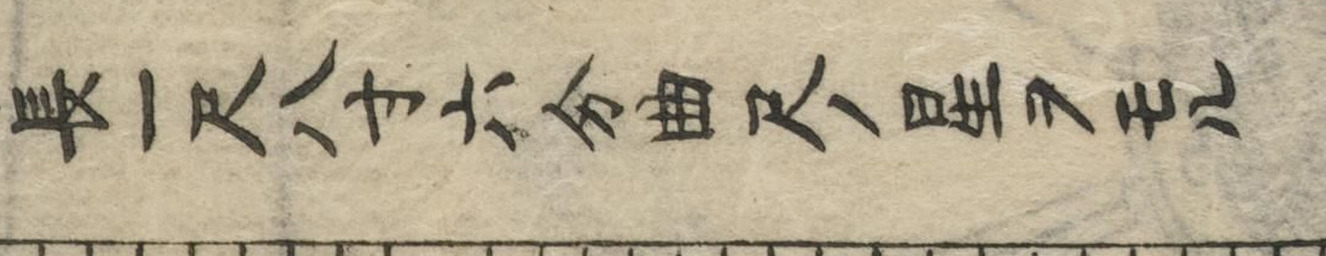長一尺八寸六分曲尺ノ星ヲモル

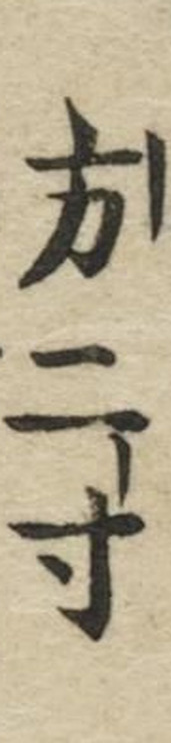方ニ寸
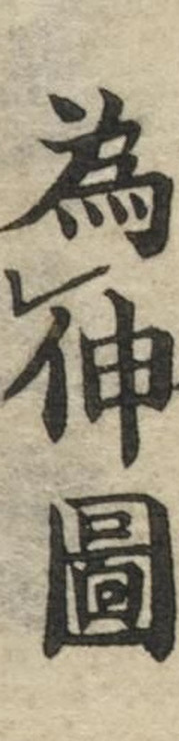為伸図
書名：量地指南　巻之一（内題）
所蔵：東京大学地震研究所図書室 Earthquake Research Institute Library, The University of Tokyo, JAPAN
